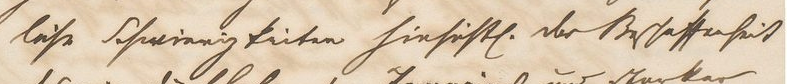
liche Schwierigkeiten hinsichtl. der Beschaffenheit
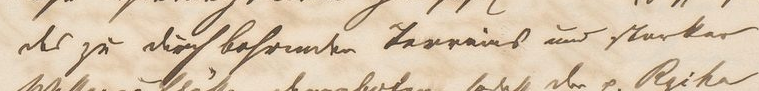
des zu durch bohrenden Terrains und starker
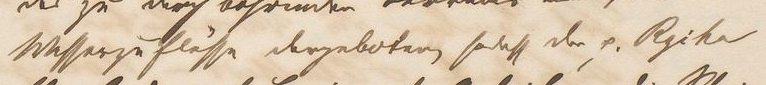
Wasserzuflüsse dargeboten, sodass der p. Rziha
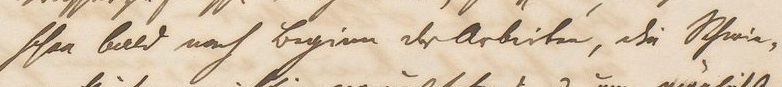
schon bald nach Beginn der Arbeiten, die Schwie-
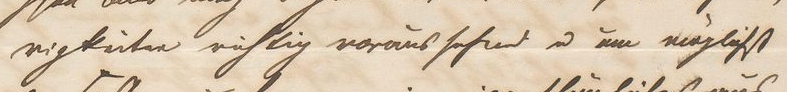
rigkeiten richtig voraus sehend & um möglichst
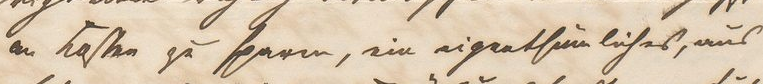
an Kosten zu sparen, ein eigenthümliches, aus
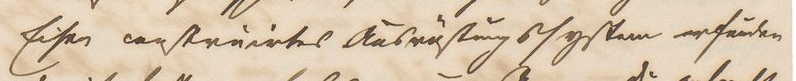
Eisen construiertes Ausrüstungssystem erfunden
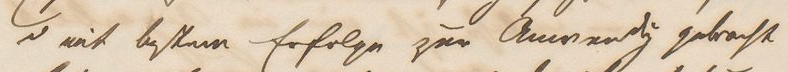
& mit bestem Erfolge zur Anwendung gebracht
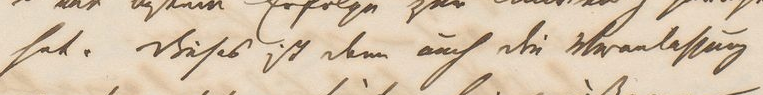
hat. Dieses ist denn auch die Veranlassung
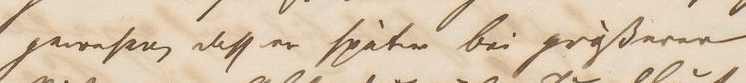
gewesen, dass er später bei größerer
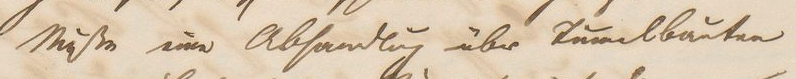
Muße eine Abhandlung über Tunnelbauten
